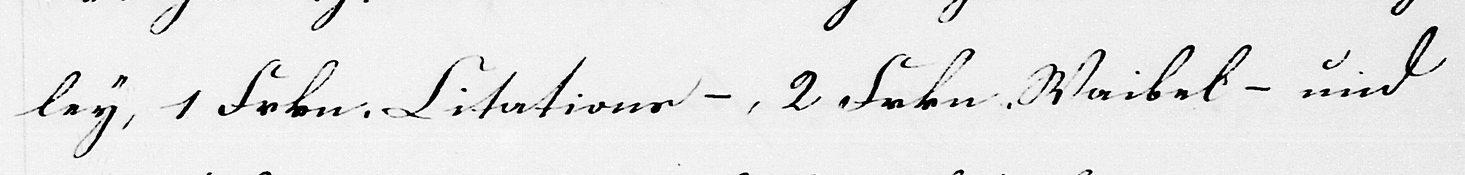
ley, 1 Frkn. Citations-, 2 Frkn Waibel- und
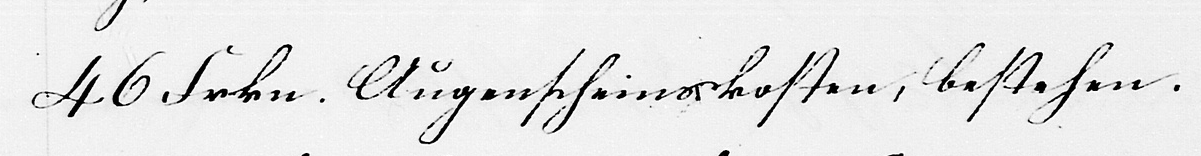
46 Frkn. Augenscheinskosten, bestehen.
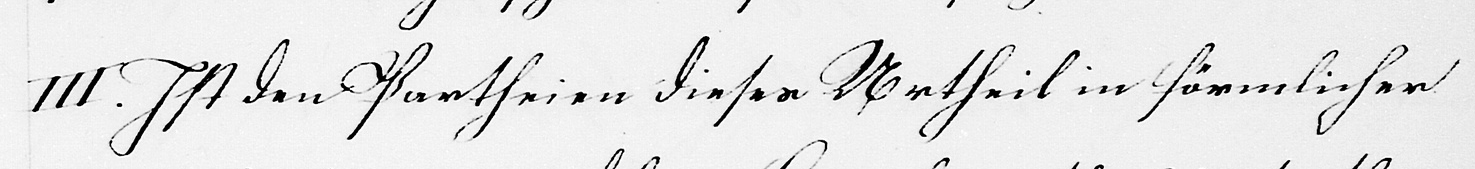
III. Ist den Partheien dieses Urtheil in förmlicher
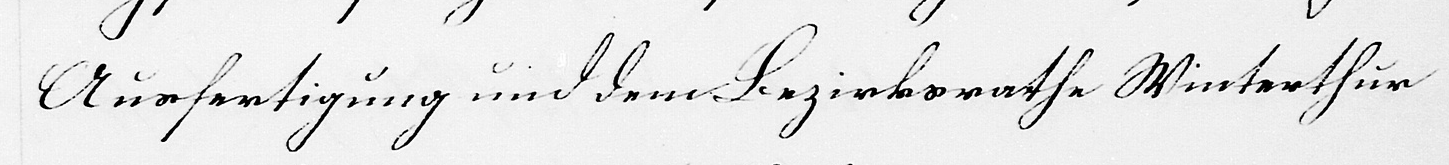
Ausfertigung und dem Bezirksrathe Winterthur
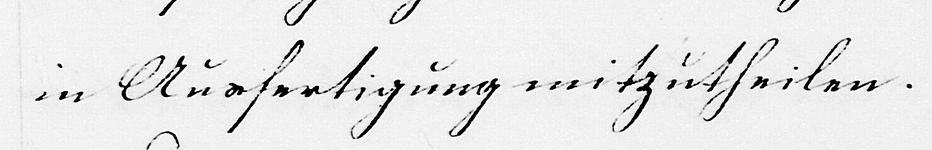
in Ausfertigung mitzutheilen.
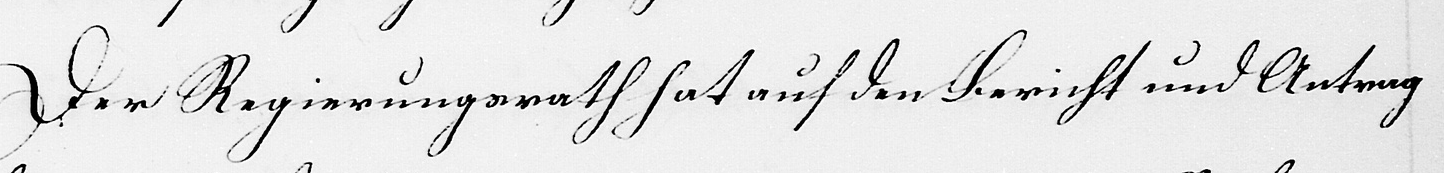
Der Regierungsrath hat auf den Bericht und Antrag
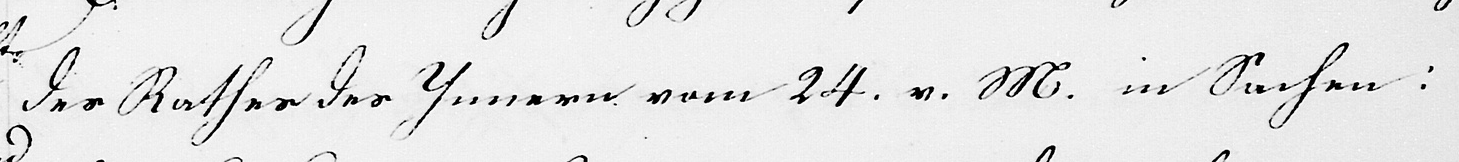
des Rathes des Innern vom 24. v. M. in Sachen:
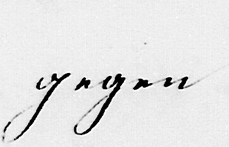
gegen
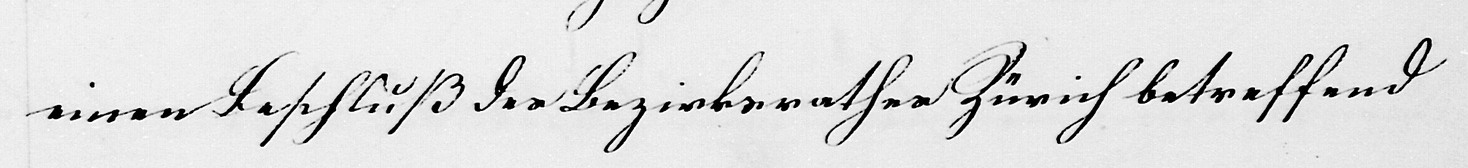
einen Beschluß des Bezirksrathes Zürich betreffend
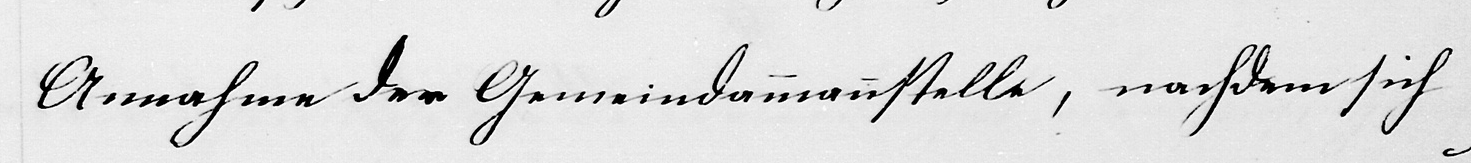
Annahme der Gemeindammannstelle, nachdem sich
